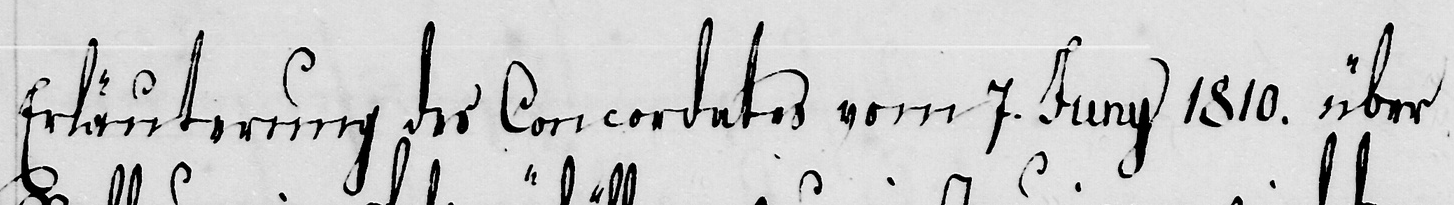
Erläuterung des Concordates vom 7. Juny 1810. über
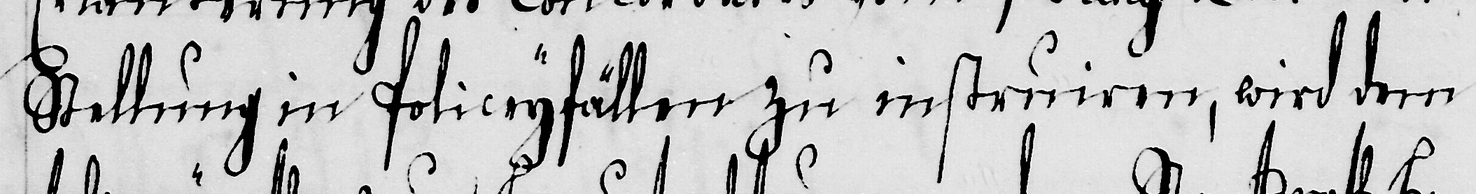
Stellung in Policeyfällen zu instruiren, wird dem
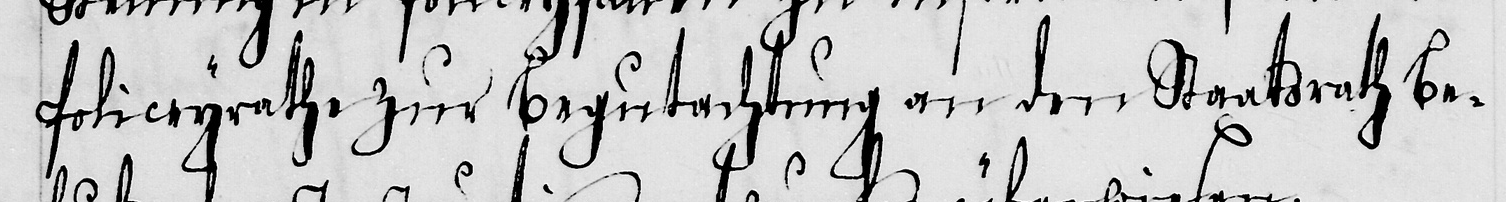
Policeyrathe zur Begutachtung an den Staatsrath Be¬
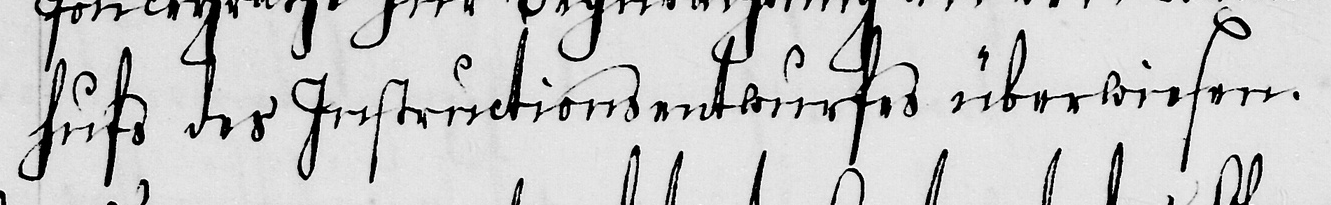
hufs des Instructionsentwurfes überwiesen.
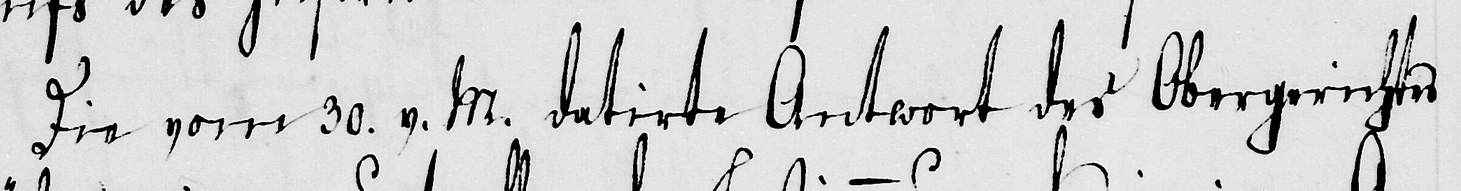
Die vom 30. v. M. datirte Antwort des Obergerichtes
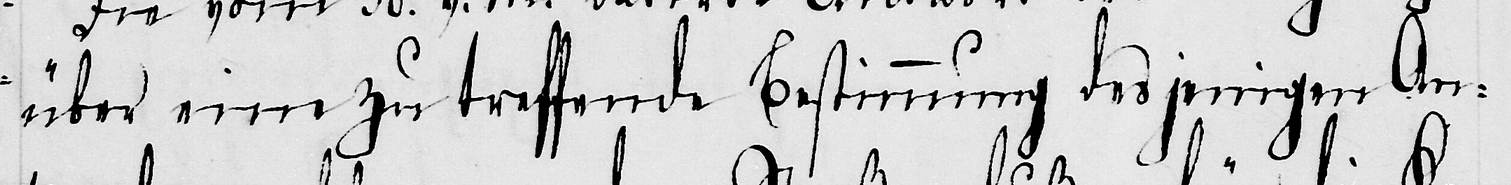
über eine zu treffende Bestimmung desjenigen An¬
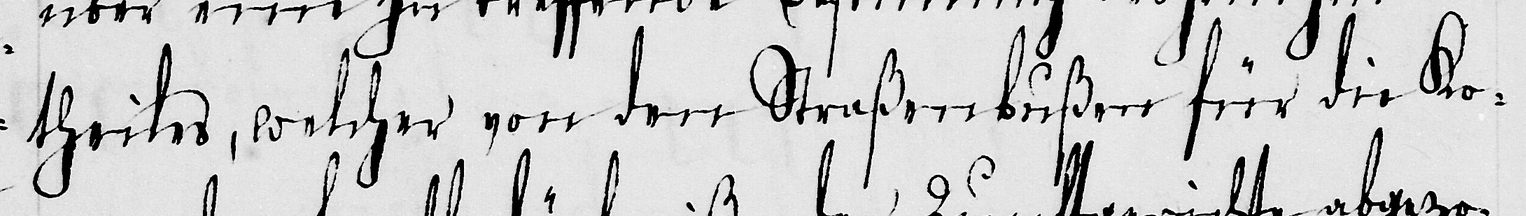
theiles, welcher von den Straßenbußen für die Ko¬
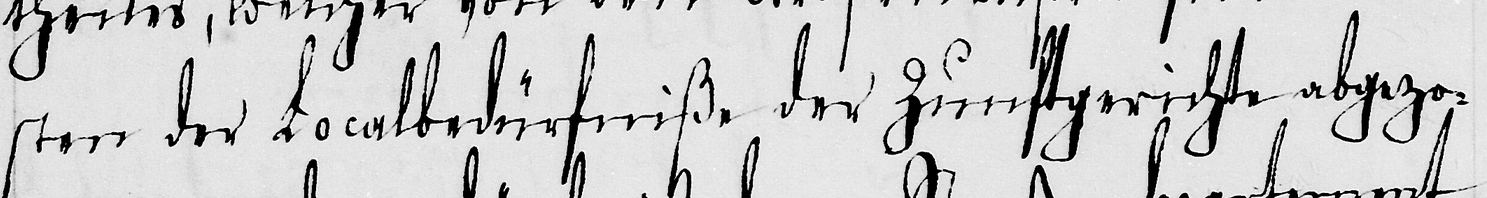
sten der Localbedürfniße der Zunftgerichte abgezo¬
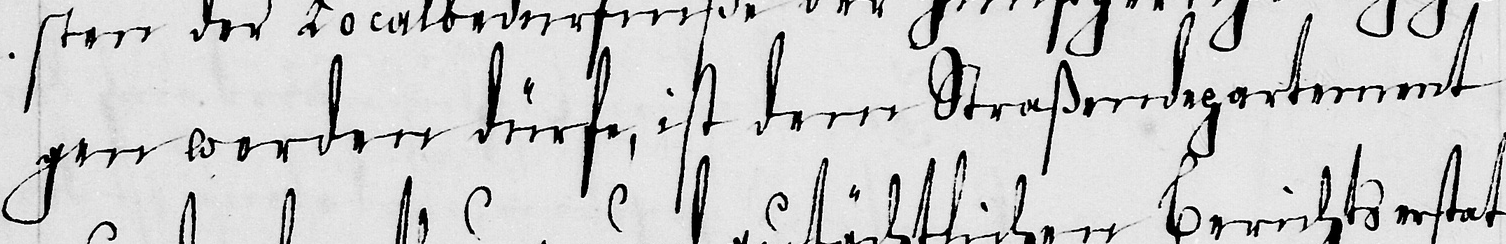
gen werden dürfe, ist dem Straßendepartement
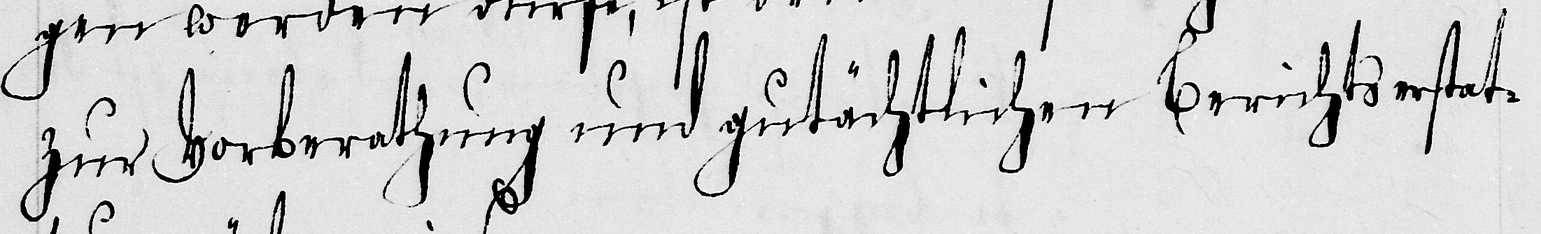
zur Vorberathung und gutächtlichen Berichtsersta¬
